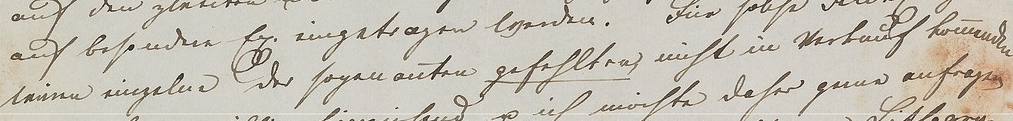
wären einzelne der sogenannten gefehlten, nicht in Verkauf kommenden
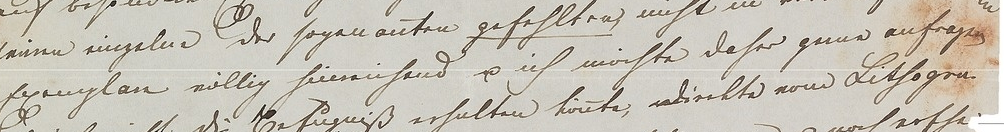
Exemplare völlig hinreichend & ich möchte daher gerne anfragen,
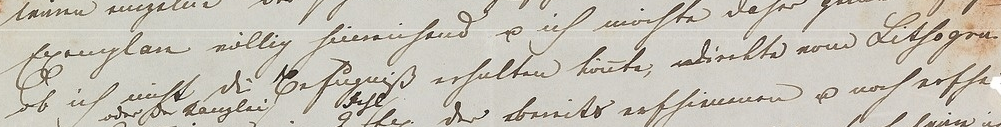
ob ich nicht die Befugniß erhalten könnte, direkte vom Lithogra-
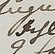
phen
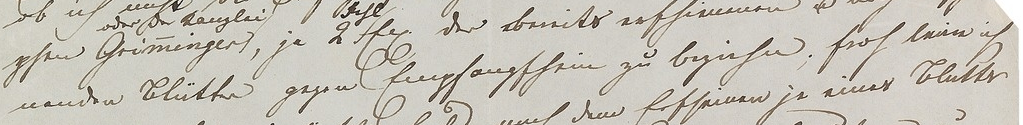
nenden Blätter gegen Empfangschein zu beziehen. Froh wäre ich,
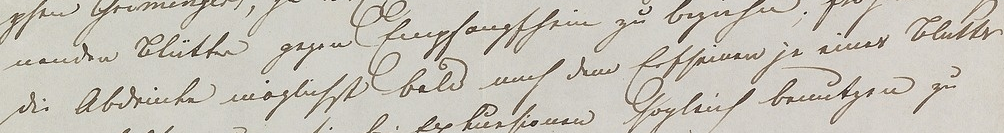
die Abdrücke möglichst bald nach dem Erscheinen je eines Blatts
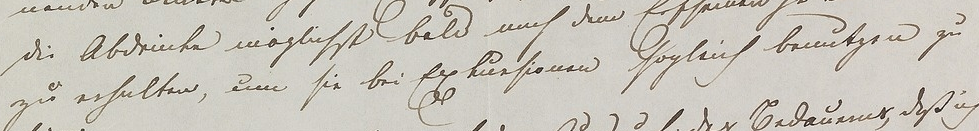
zu erhalten, um sie bei Exkursionen sogleich benutzen zu
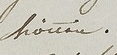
können.
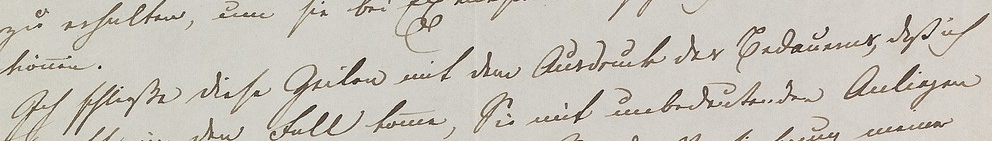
Ich schließe diese Zeilen mit dem Ausdruck des Bedauerns, daß ich
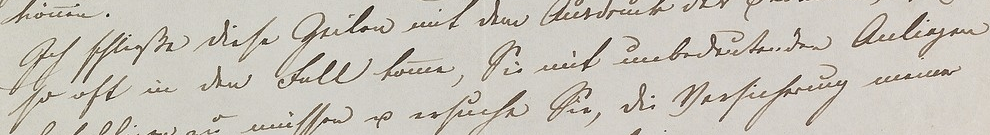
so soft in den Fall komme, Sie mit unbedeutenden Anliegen
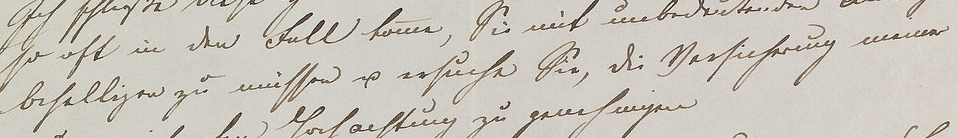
behelligen zu müssen & ersuche Sie, die Versicherung meiner
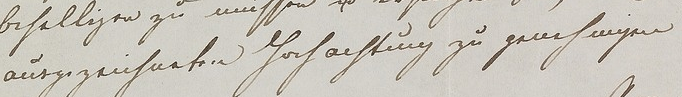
ausgezeichneten Hochachtung zu genehmigen
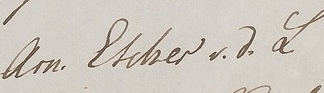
Arn. Escher v. d. L.
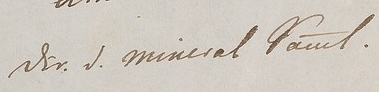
Dir. d. mineral Samml.
